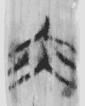亦
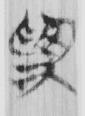受
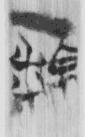{帛㡀}
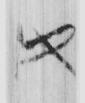女
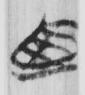廼
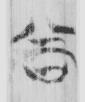尚
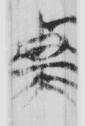{真天}（祗）
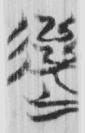逆
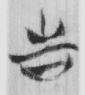告
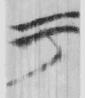于
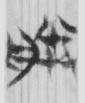朕
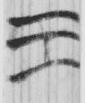王
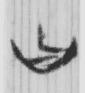曰
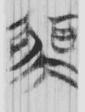{聑大}
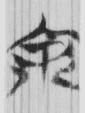余
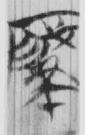肈
